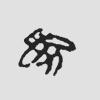{爪家}
